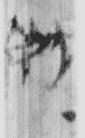死
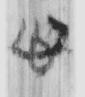心
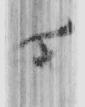氒
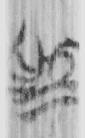爲
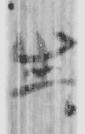生
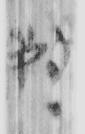死
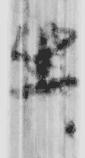生
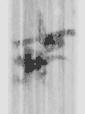才
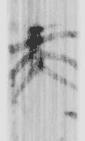天
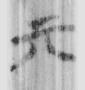亓
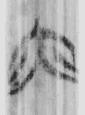亦
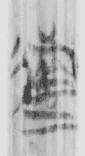{止達}
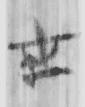才
